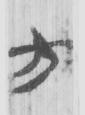方
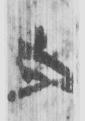之
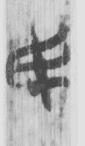民
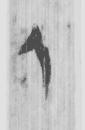人
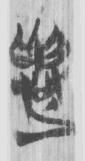{與口止}
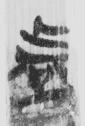者
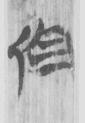於
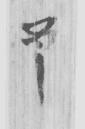邑
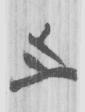之
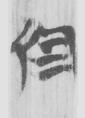於
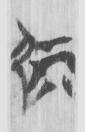凥
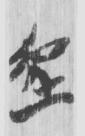𫊟
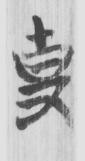吏
